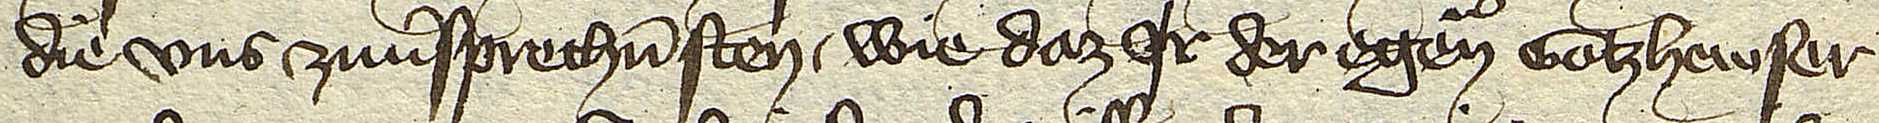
die vns cʒuu*ſprechn* ſten / wie daʒ Ir der egen* Gocʒhewſer
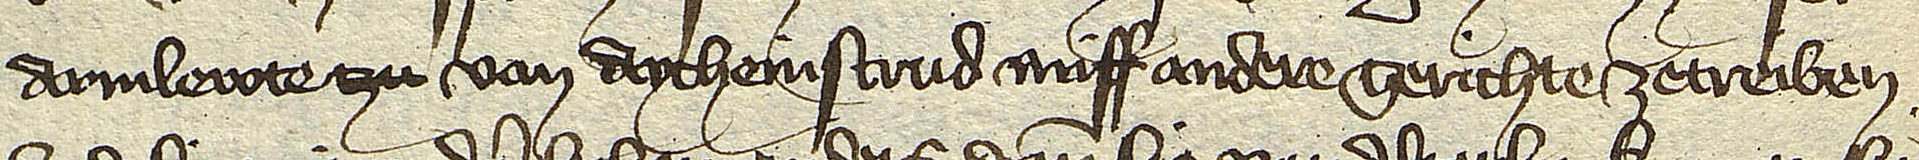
Armlewte tʒu von Aycheinſtrud auff andere gerichte cʒetreiben
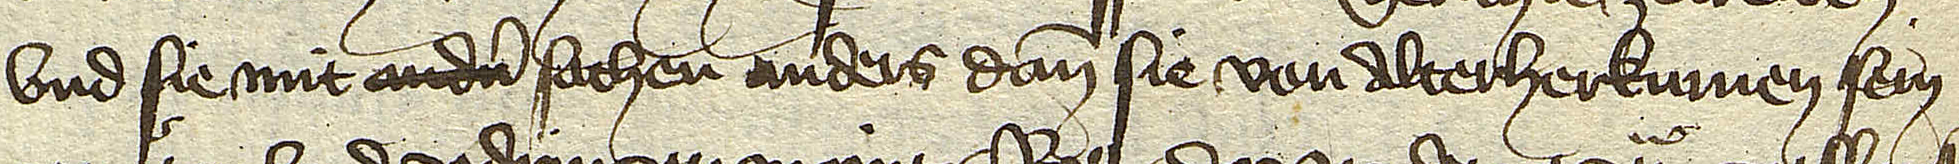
vnd ſie mit andn* ſachen anders dan* ſie von Alterherkumen ſein
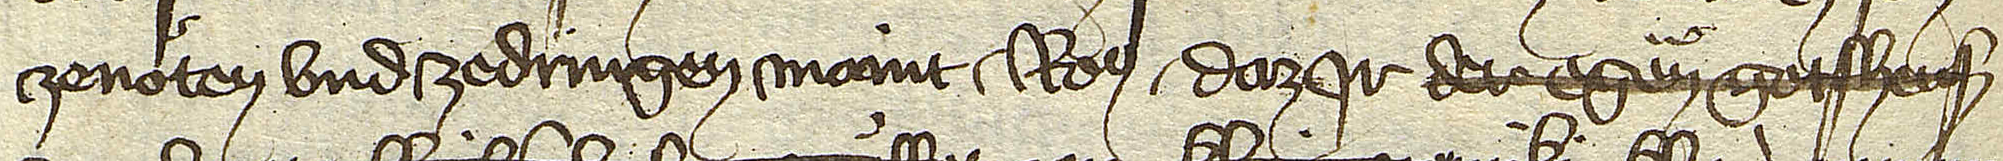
cʒenöten vnd cʒedringen maint / Ro* / daʒ Ir der egen* gotheuſ*
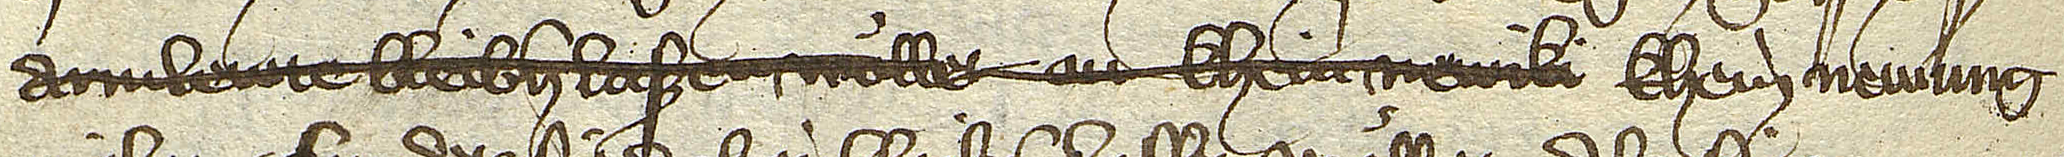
Armlewte bleibn* laſʒe* wöllet an khein newiki khein newung
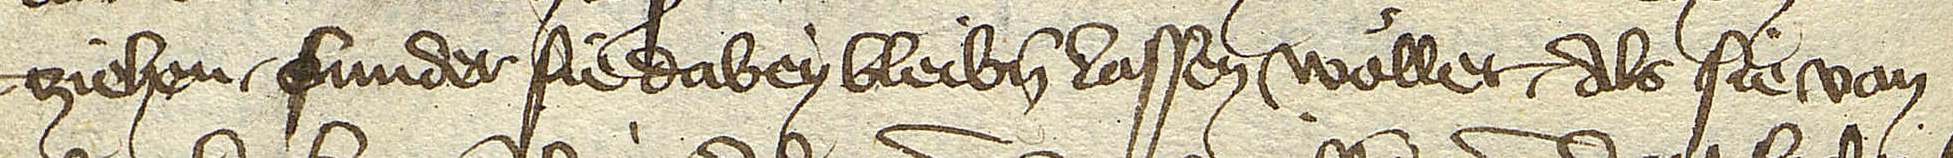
cʒiehen / ſunder ſie dabey bleibn* laſſen wöllet / Als ſie von
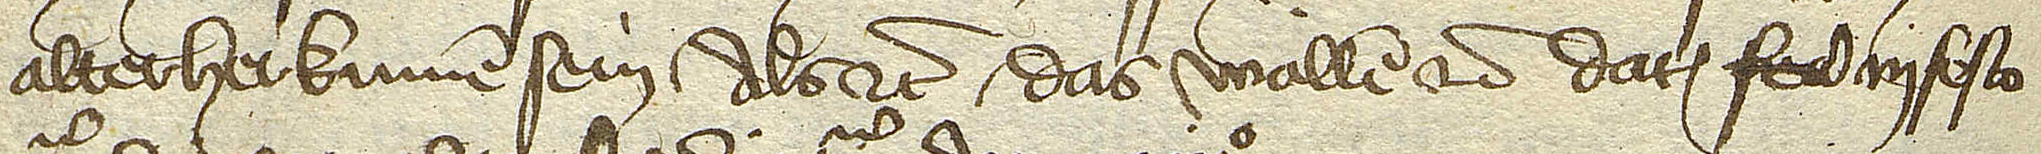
alterherkume* ſein / Als ec* / das wölle* ec* dat* fea* in ſeſto
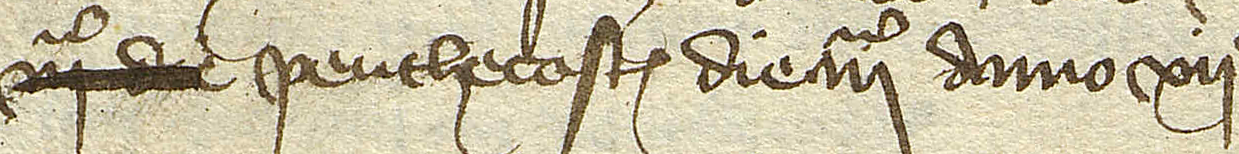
iii* die penthecoſt* die iii* Anno xii*
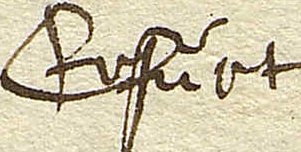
Erfürt
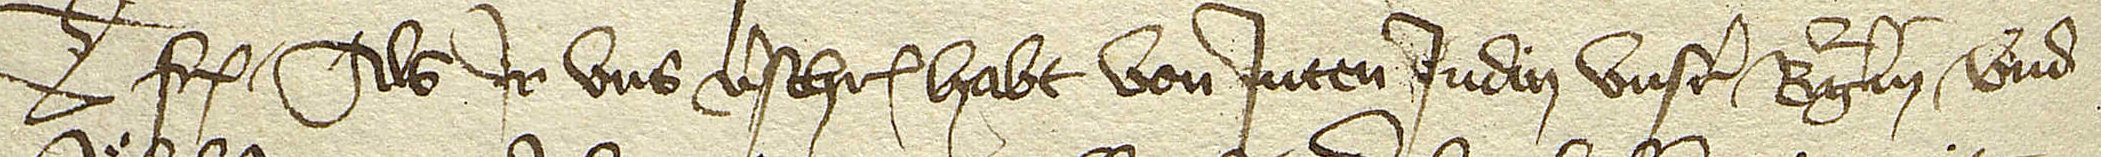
L* fr* / Als Ir vns v*ſchr* habt von Iuten Iudin vnſr* B*g*in / vnd
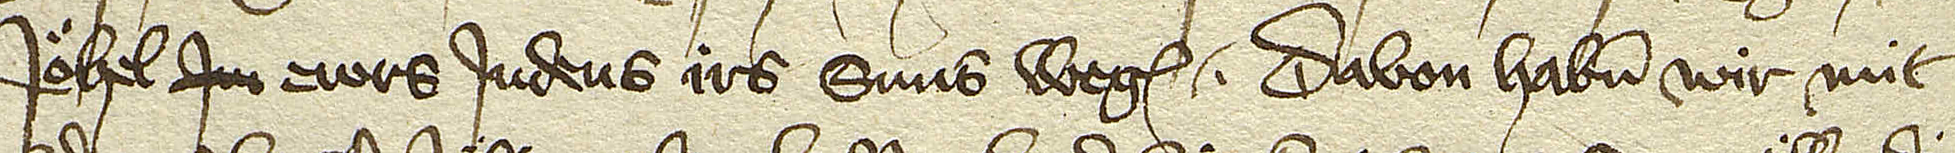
Iöhel Im ewrs Iudens irs Suns weg* / . Davon habn* wir mit
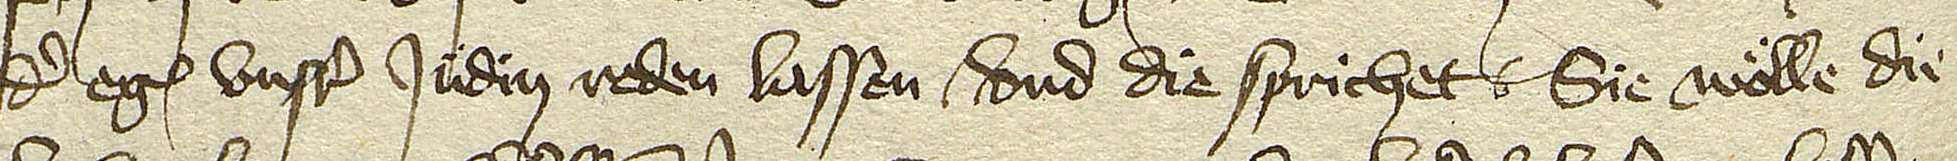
d* eg* vnſr* Iüdin reden laſſen / vnd die ſprichet / Sie wölle die
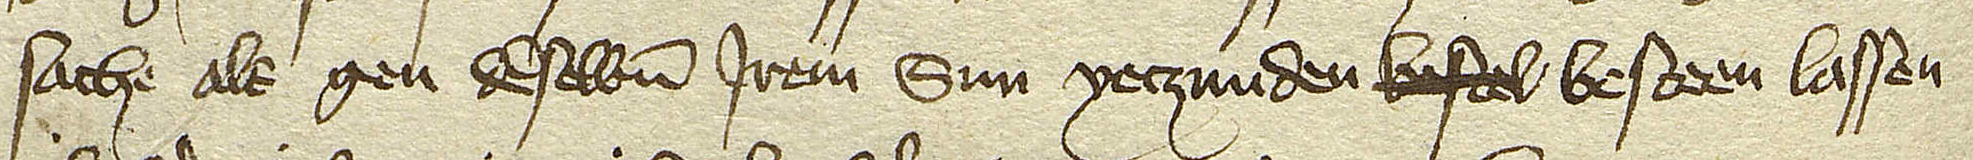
ſache als gen d*ſelbn* Irem Sun yecʒnden beſtel beſteen laſſen
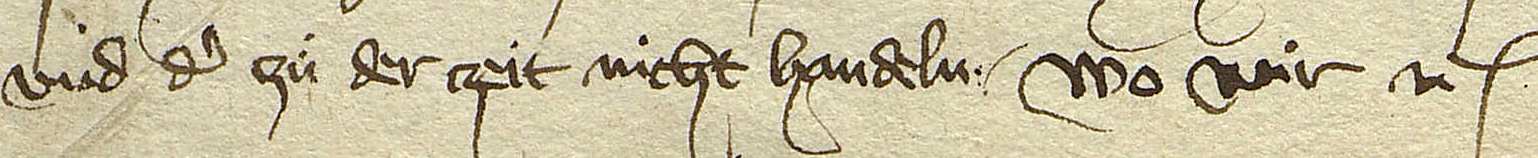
wid* d* cʒü der cʒeit nicht handeln / wo wir ec*
